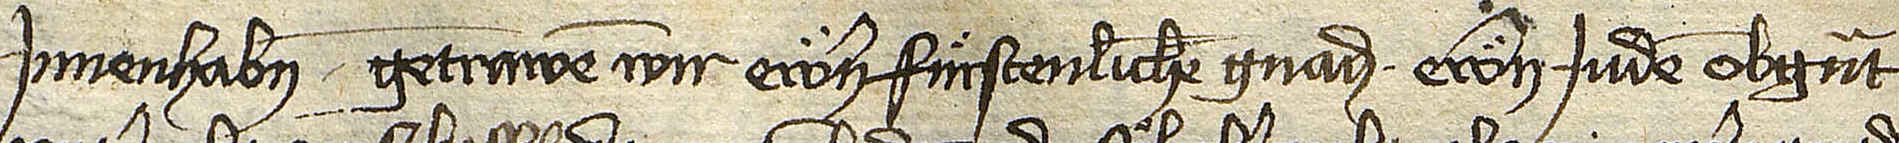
Innenhabn* / getrawe* wir eẅ*n fürſtenliche* gnad* . eẅ*n Iude* obgnt*
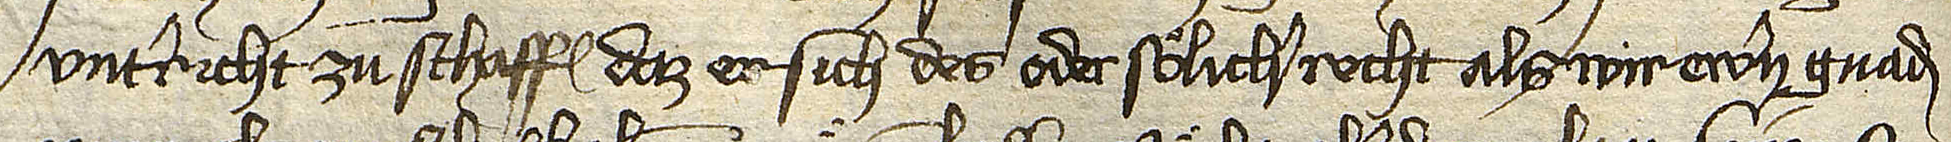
vnt*richt ʒu ſchaff* daʒ er ſich des oder ſölich* recht als wir ew*n gnad*
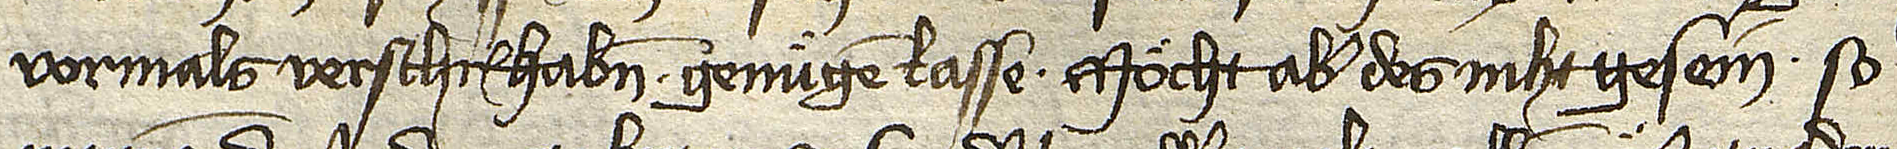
vormals verſchr* habn* . genüge* laſſe . Möcht ab* des niht geſein . ſo
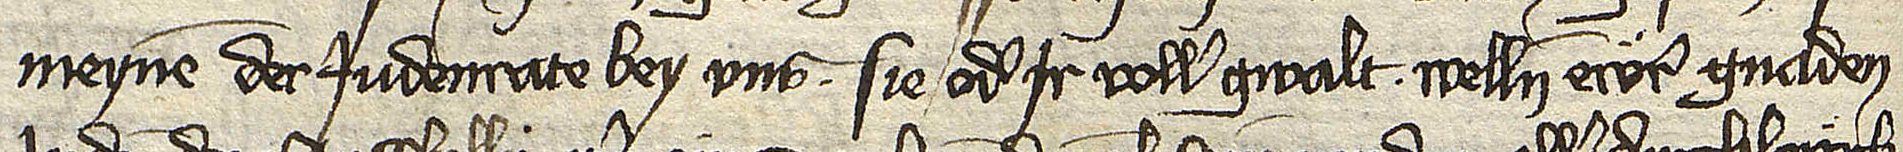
meyne* der Iudenrate bey vns . ſie od* Ir voll* gwalt . welln* eẅr* gnaden
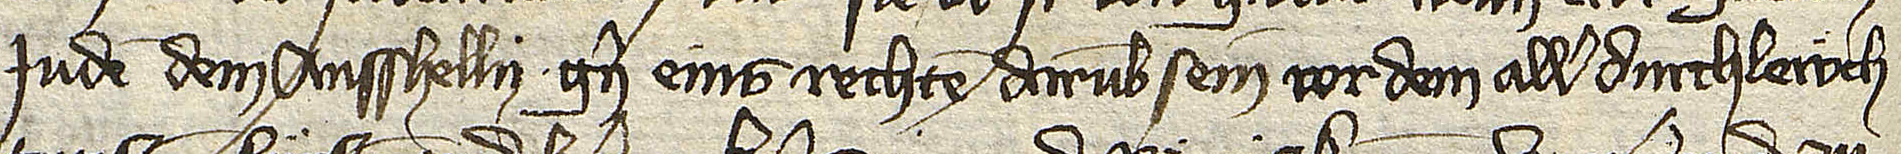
Iude* dem Anſſhelln g*n eins rechte* darub* ſein vor dem all*durchleẅch
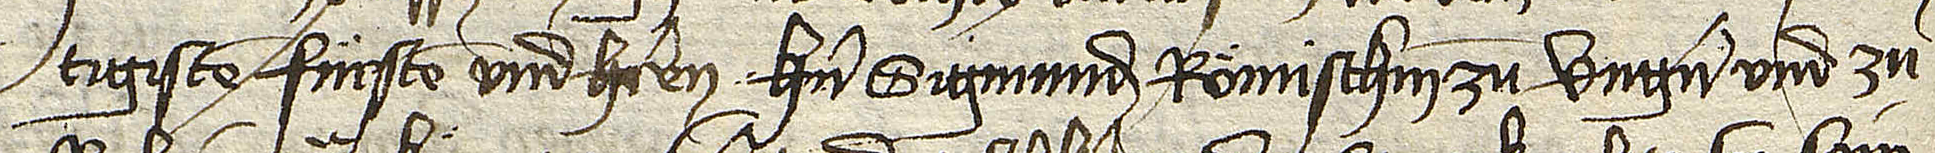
tigiſe* fürſte* vnd h*ren / hn* Sigmund* Römiſchm* ʒu Vng*n vnd ʒu
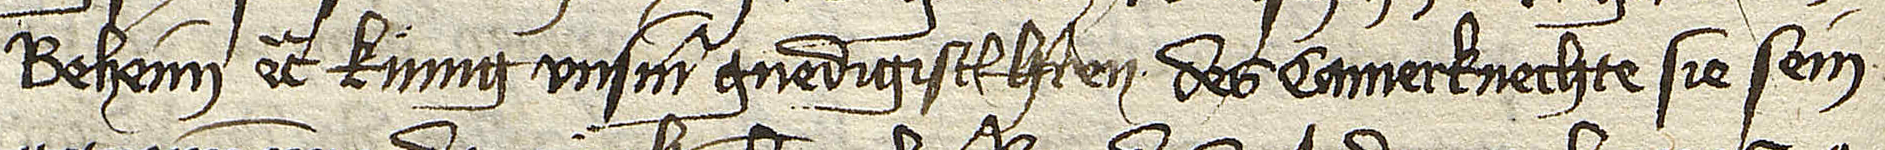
Beheim ec* künig vnſm* gnedigiſt* h*ren . Des Camerknechte ſie ſein
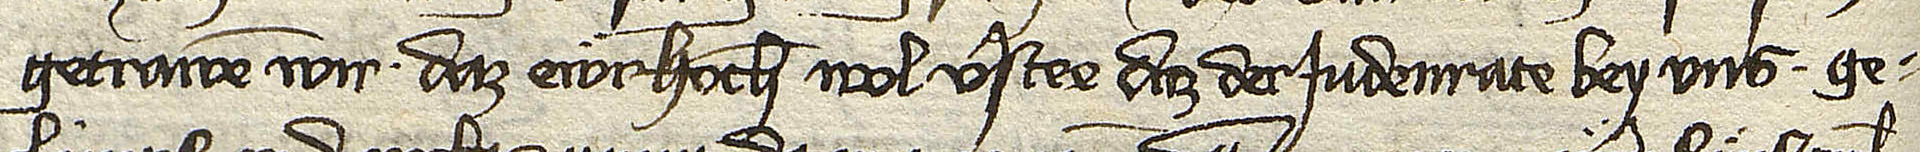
getrawe* wir . daʒ eẅr hoch* wol v*ſtee daʒ der Iudenrate bey vns . ge =
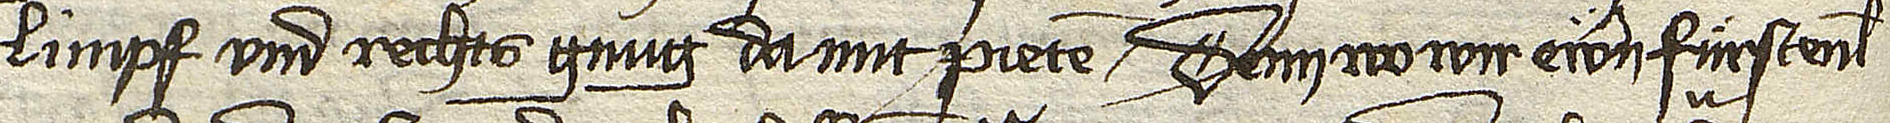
limpf vnd rechts gnug da mit piete* / Denn wo wir eẅ*n fürſtenl*
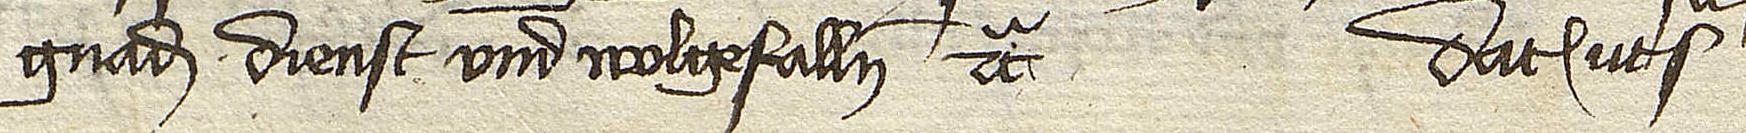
gnad* dienſt vnd wolgefalln* ec* Dat* ut ſ*
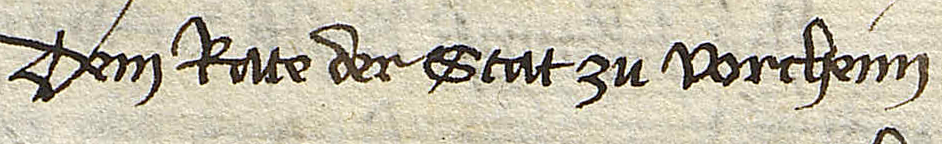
Dem Rate der Stat ʒu vorcheim
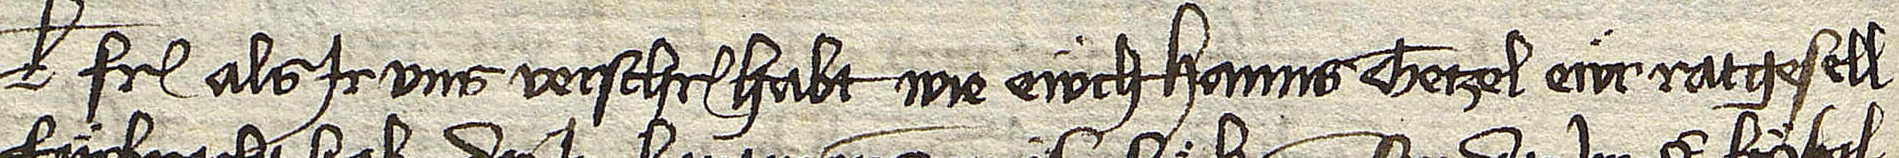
L* fr* als Ir vns verſchr* habt wie eẅch hanns Tecʒel eẅr ratgeſell
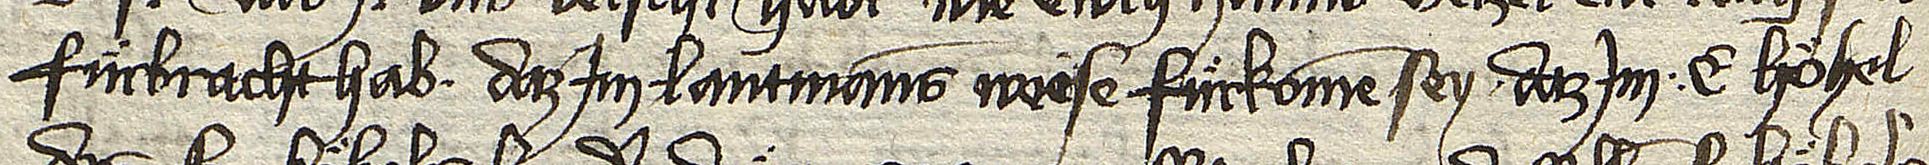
fürbracht hab . daʒ Im lantman*s weiſe fürkome* ſey / daʒ Im C höhel
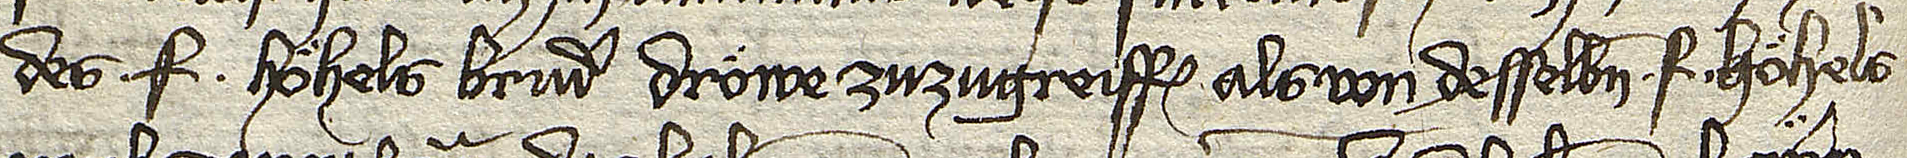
des . f . höhels brud* dröwe ʒuʒugreiff* als von deſſelbn* . f . höhels
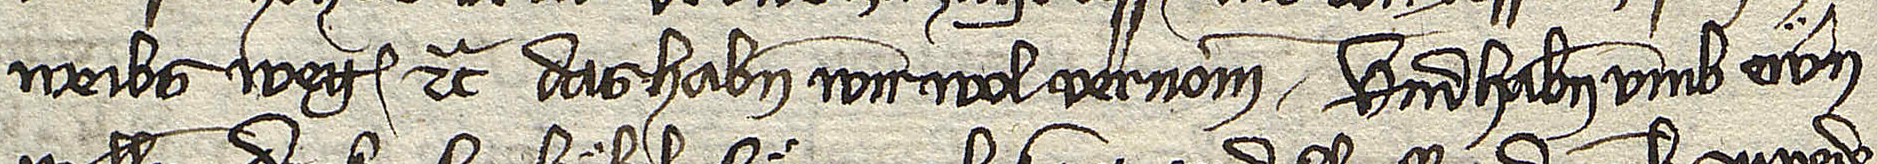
weibs weg* ec* das habn* wir wol vernom* / Vnd habn* vmb eẅ*n
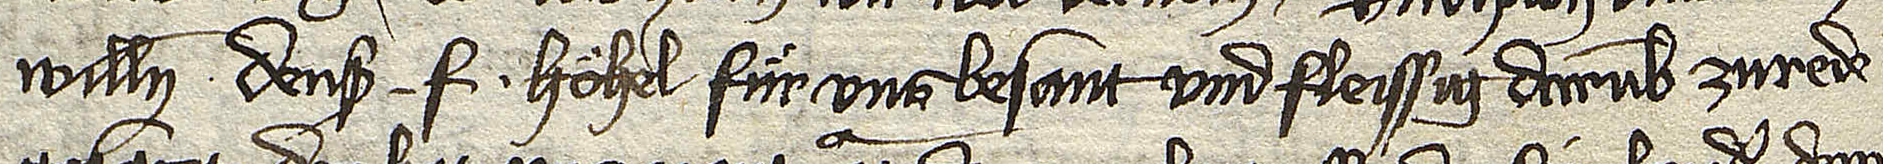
willn* Denſ* . f . höhel für vns beſant vnd fleiſſig darub* ʒurede
